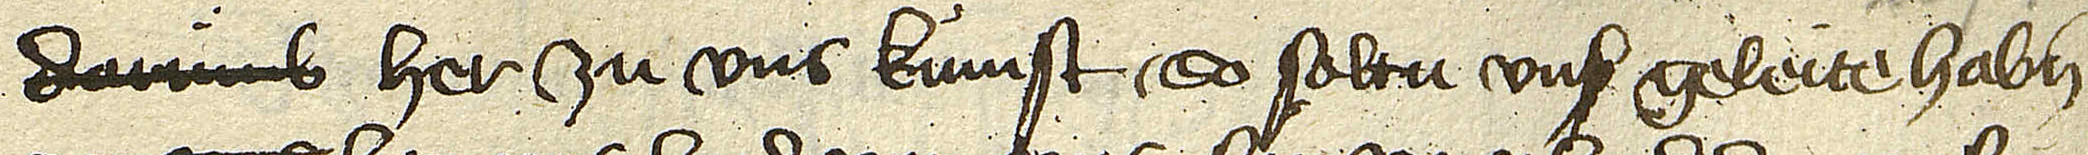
darümb her cʒu vns kümſt / So ſoltu vnſ* geleite habn*
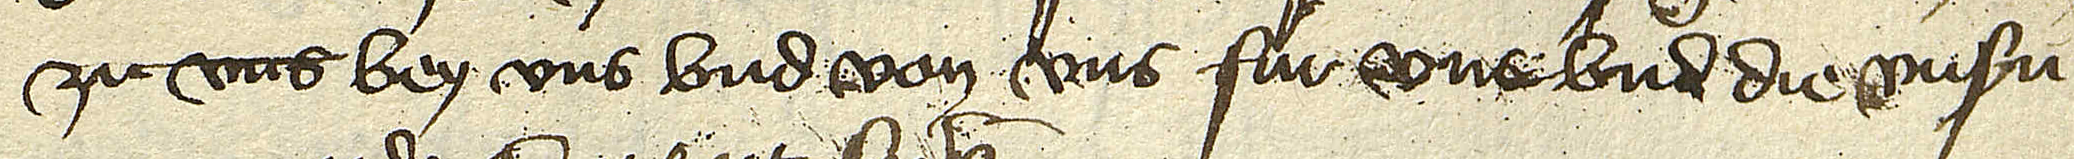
cʒu vns vnd von vns für vns vnd die vnſ*n
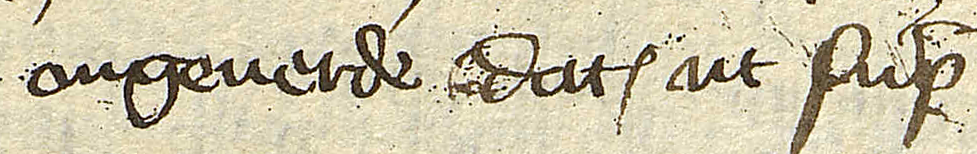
ongeuerde / dat* ut ſup*
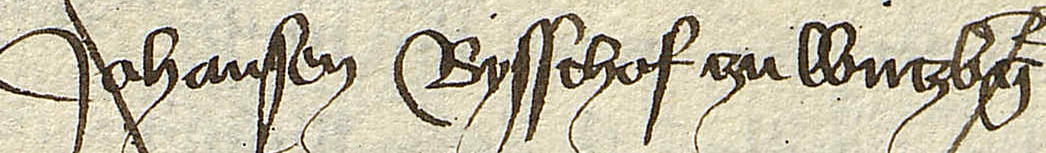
Iohanſen Byſſchof cʒu wircʒb*g
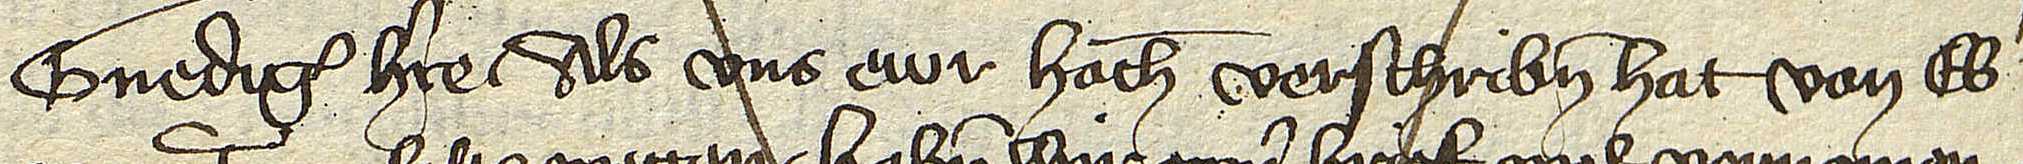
Gnedig* h*re / Als vns ewr hoch* verſchribn* hat von Eb*
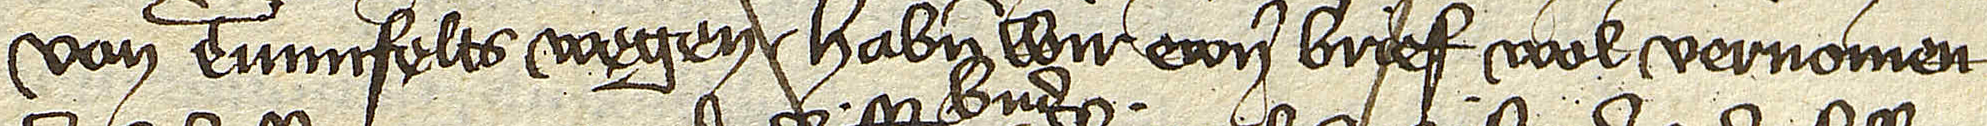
von Tünnfelts wegen / habn* wir ewn* brief wol vernomen
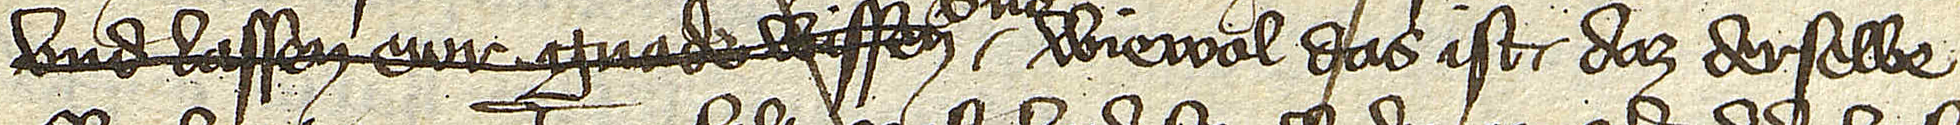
vnd laſſen ewr gnade wiſſen / wiewol das iſt / daʒ derſelbe
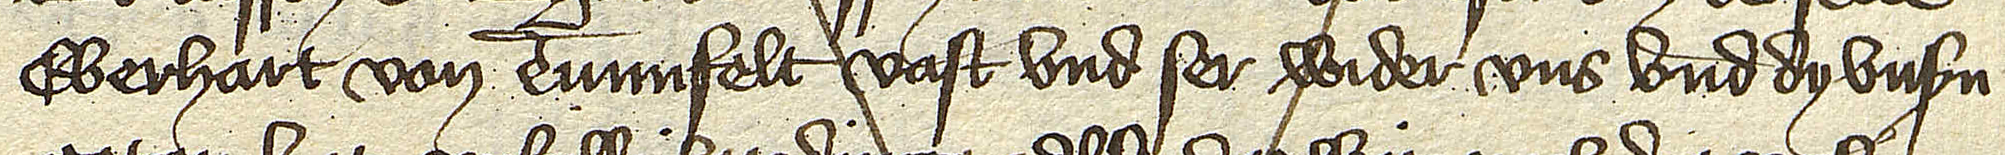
Eberhart von Tunnfelt vaſt vnd ſer wider vns vnd dy vnſ*n
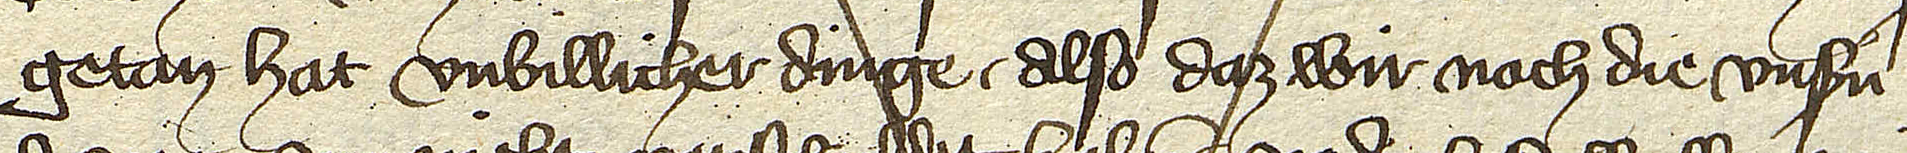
getan hat vnbillicher dinge / Alſo daʒ wir noch die vnſ*n
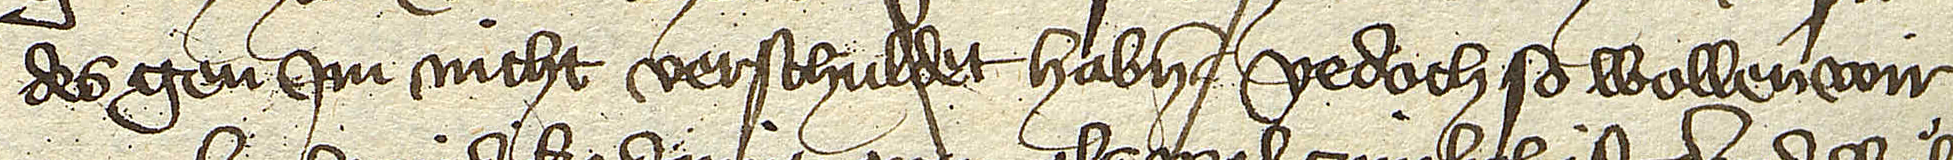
des gen Im nicht verſchuldet habn* / yedoch ſo wollen wir
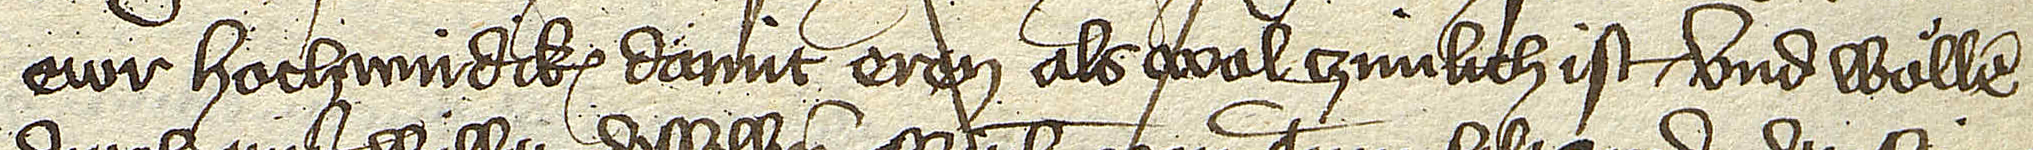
ewr hochwirdik* damit eren als wol cʒimlich iſt / vnd wölle*
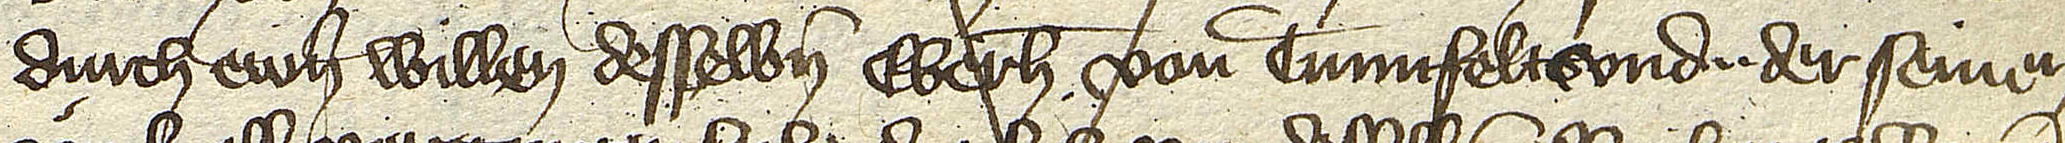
durch ewn* willen deſſelbn* Eberh* von Tunnfelts vnd ~ der ſeinen
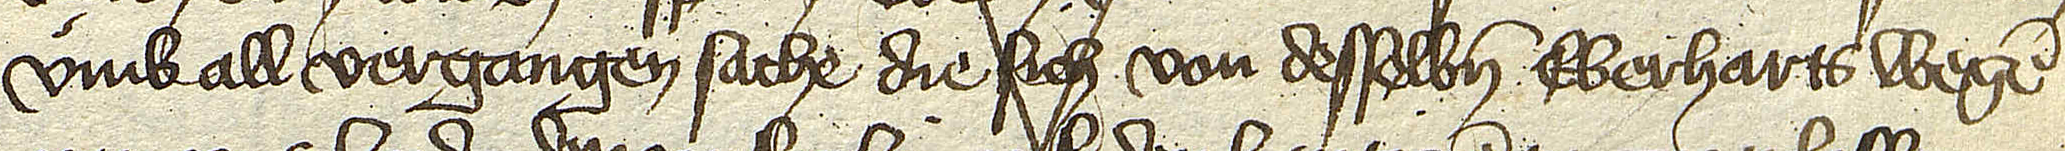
v̈mb all vergangen ſache die ſich von deſſelbn* Eberharts wege*
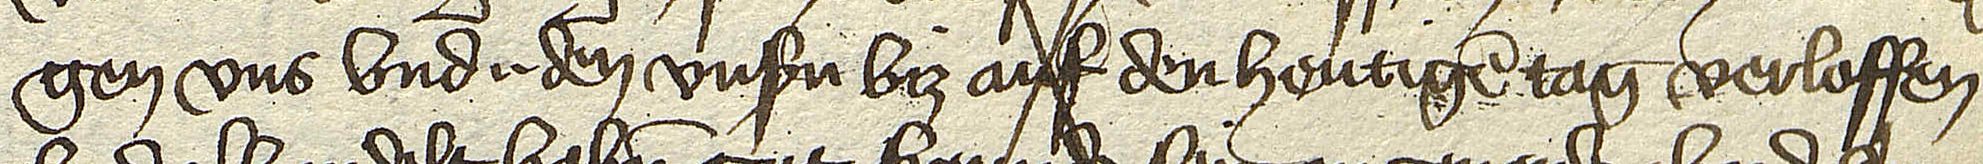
gen vns vnd ~ den vnſ*n biʒ auf den heutige* tag verloffen
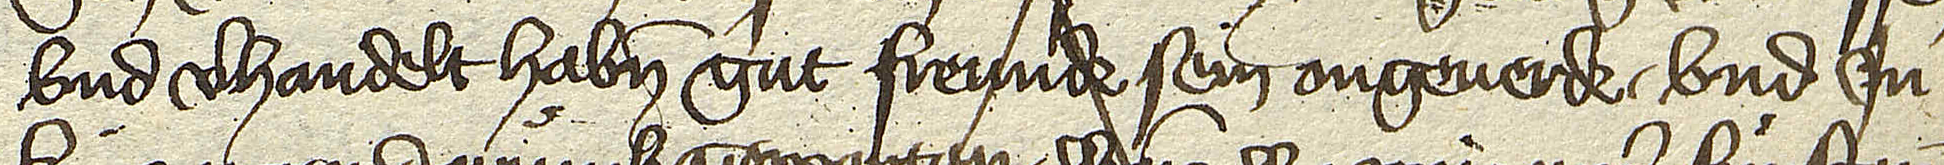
vnd v*handelt habn* gut freunde ſein ongeuerde / vnd In
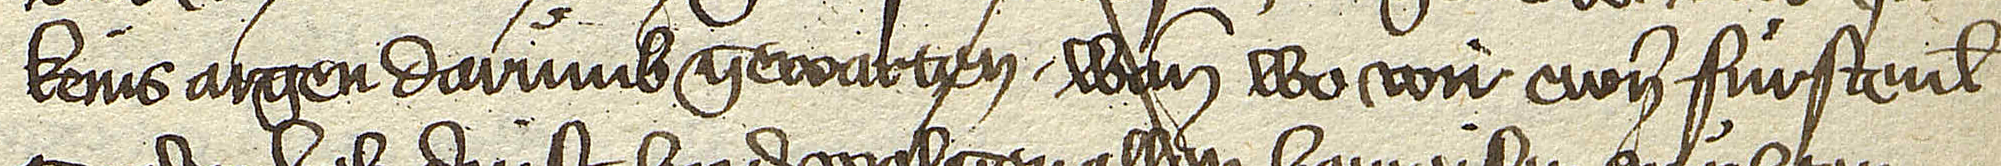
keins argen darümb gewarten / wan* wo wir ewn* fürſtenl*
